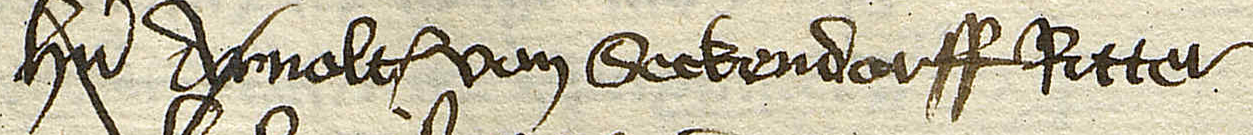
h*n Arnolt* von Seckendorff Ritt*
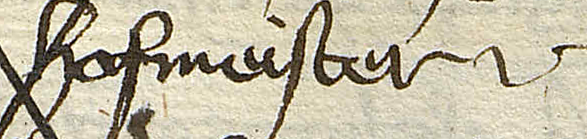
hofmeiſter ec*
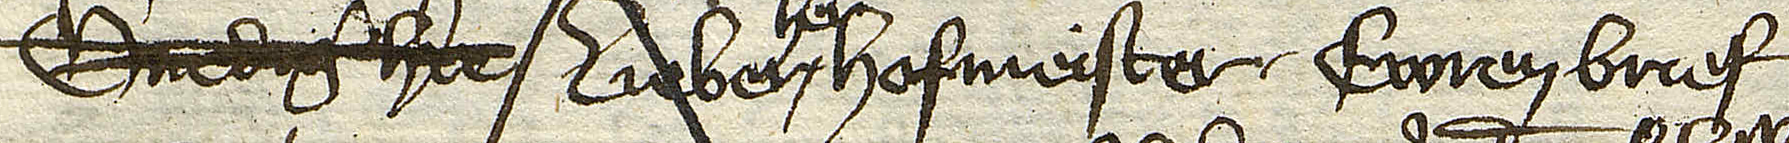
Gnedig* h*re Lieber hofmeiſter / Ewren brief
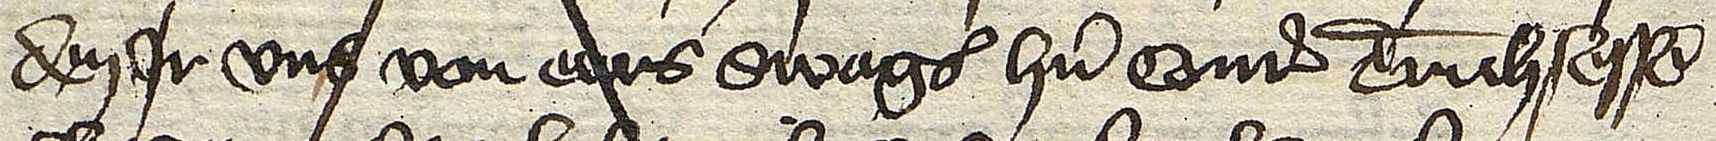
den Ir vns von ewrs Swags* h*n Conr* Truchſeſſe*
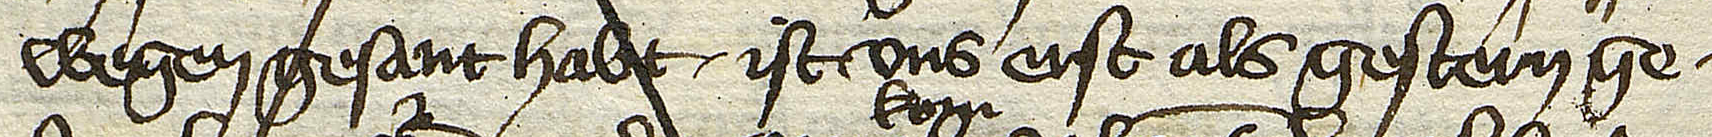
wegen geſant habt / iſt vns erſt als geſtern ge =
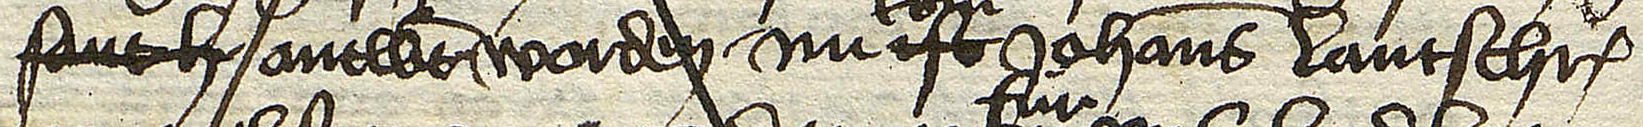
ſant h antw*t worden / Nu iſt Iohans* lantſchr*
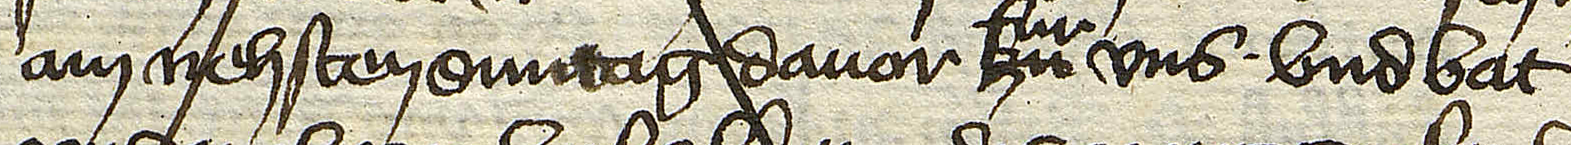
am nehſten Suntag dauor ʒu vns . vnd bat
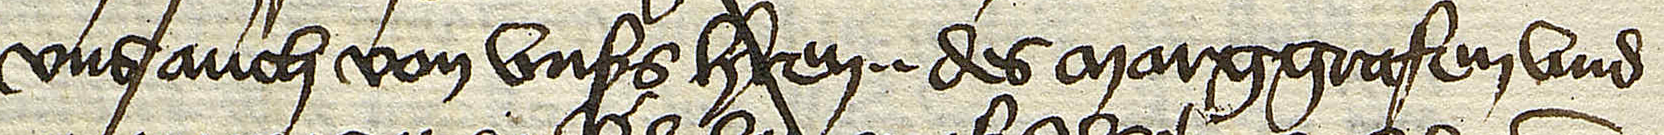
vns auch von vnſ*s h*ren ~ des Marggrafen vnd
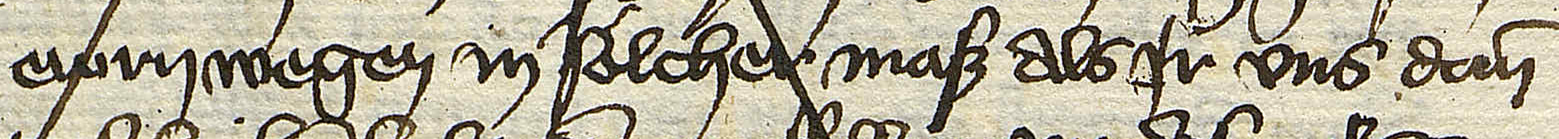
ewrn wegen in ſölcher maſʒ Als Ir vns dan*
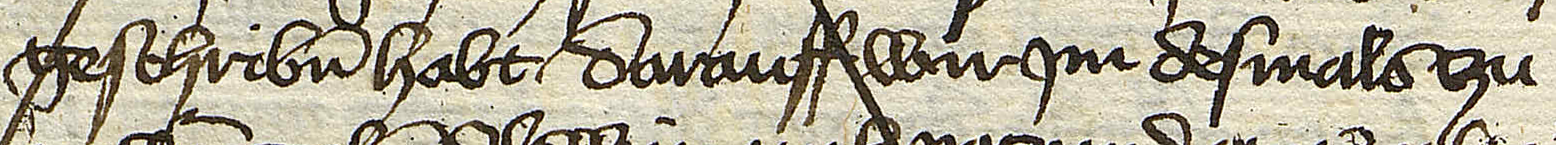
geſchrib*n habt / Darauff wir Im deſmals cʒu
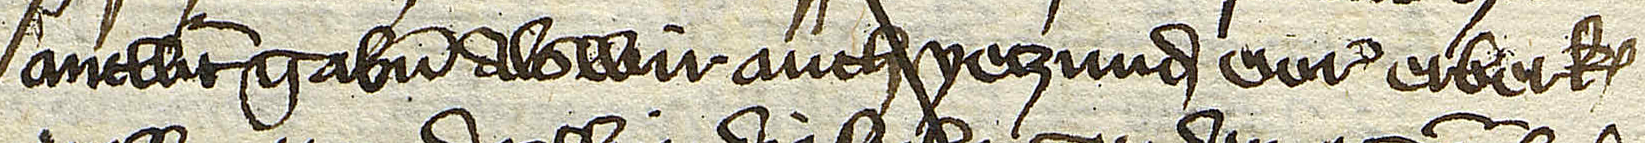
a.... gabn* Als wir auch yecʒ vnd ... erberk*
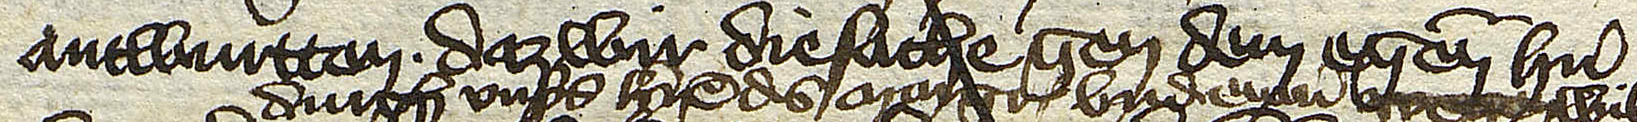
antwurtten . daʒ wir die ſache gen egen* hn*
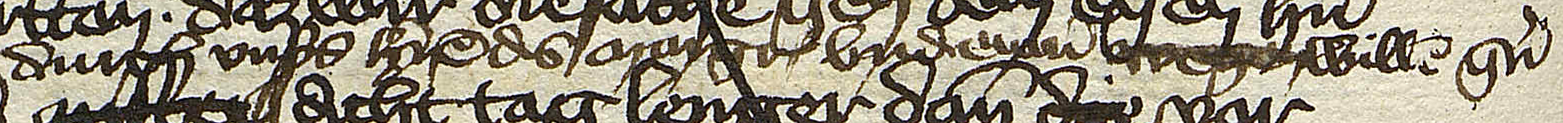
durch vnſ*s h*re* des Margr* vnd ewn* wegen wille* g*n
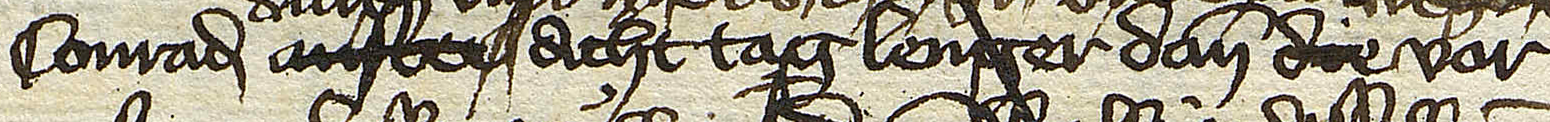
Conrad* anſtee Acht tag lenger dan* die vor
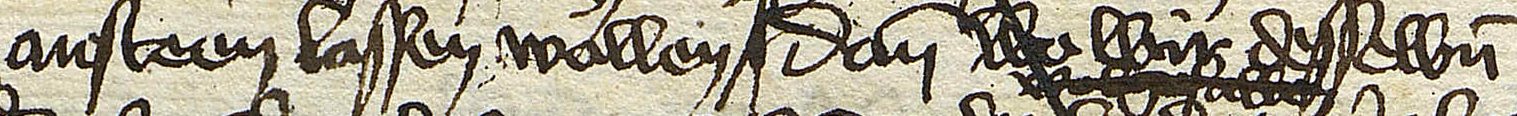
anfteen laſſen wöllen / Dan* wo wir deſſelb*n
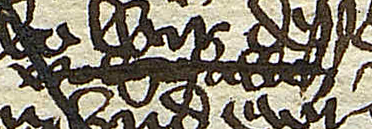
wolgefallen
